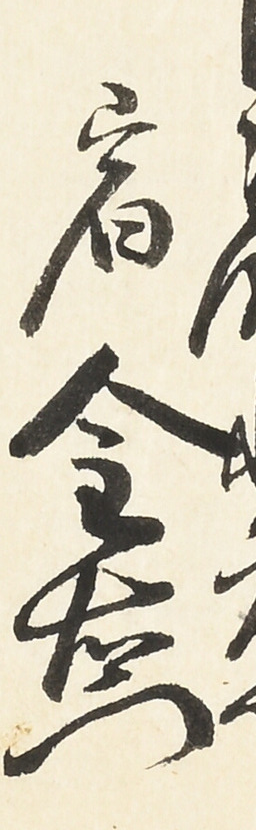宿金右衛門
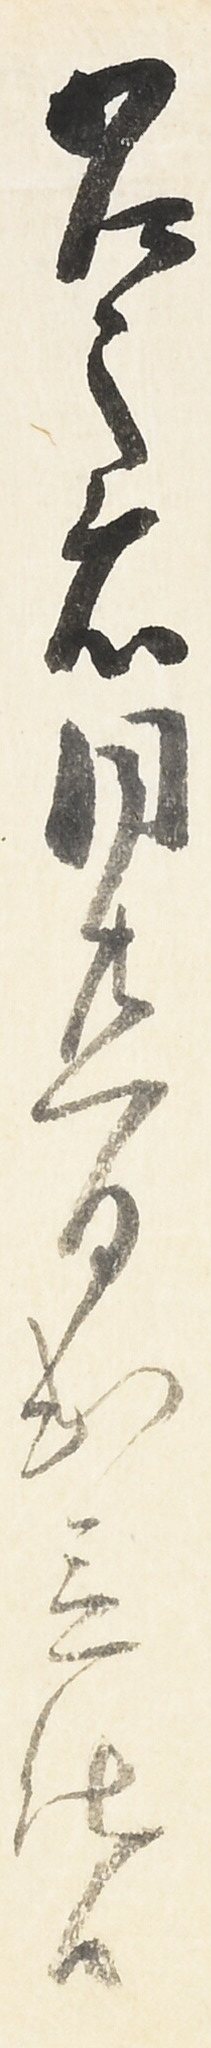右之者同廿一日出立仕候
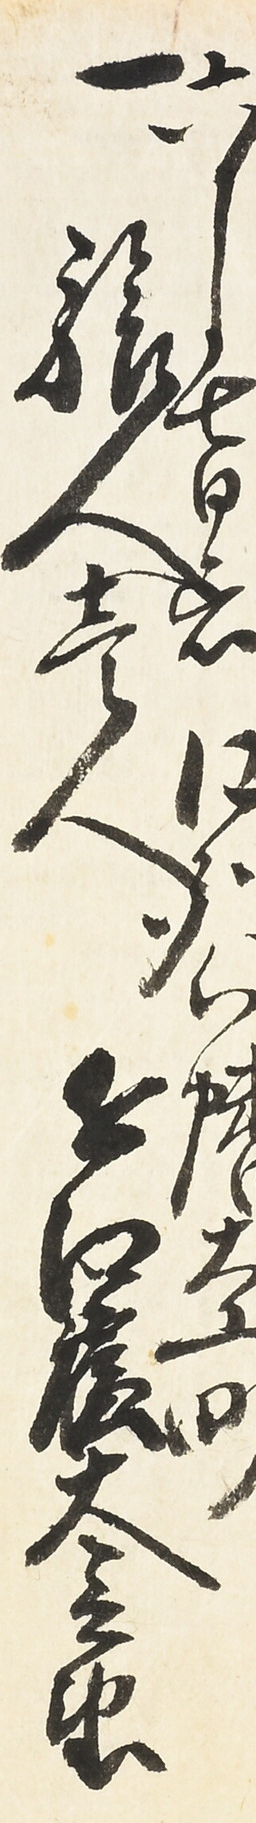一旅人壱人近江屋太兵衛
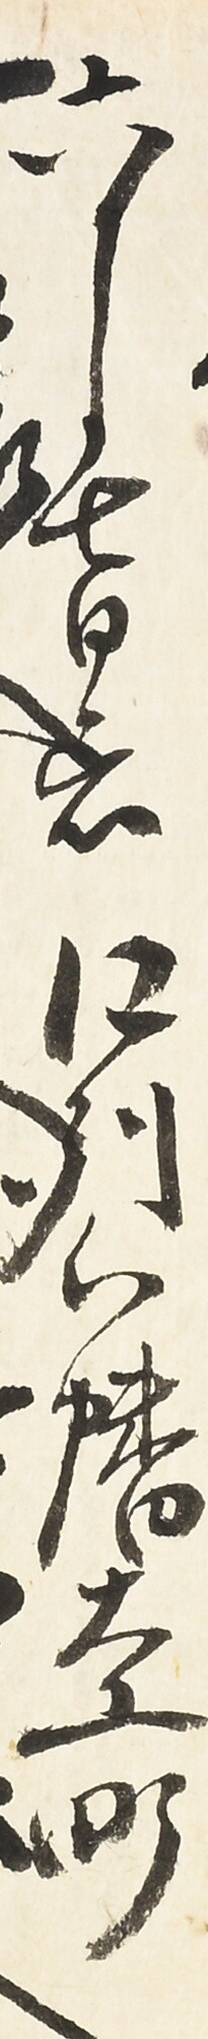六月七日着江州八幡大工町
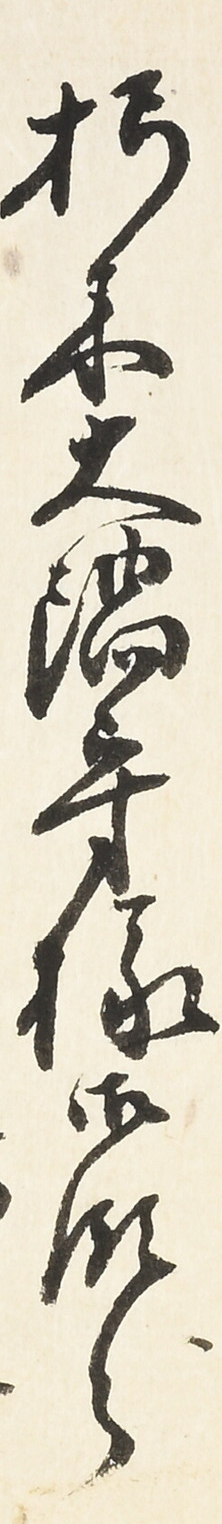朽木大隅守様御領分
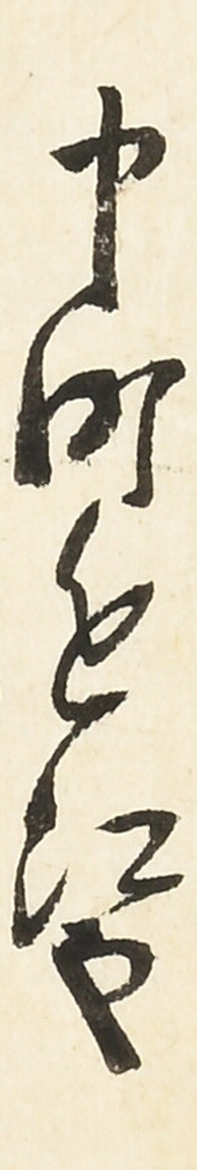中町近江や
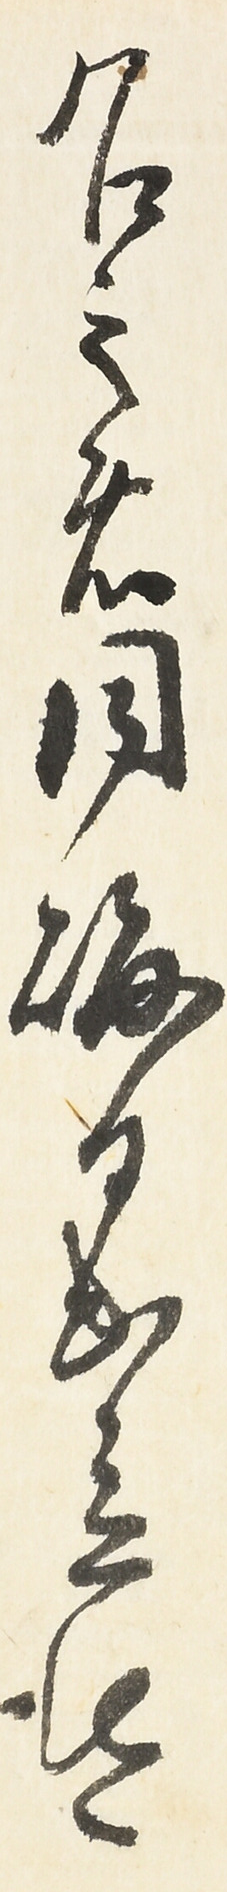右之者同晦日出立仕候
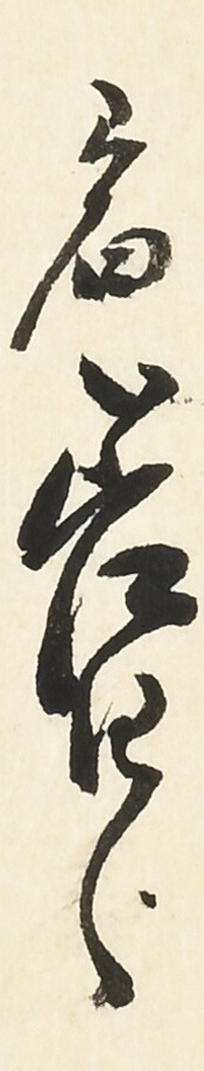宿善四郎
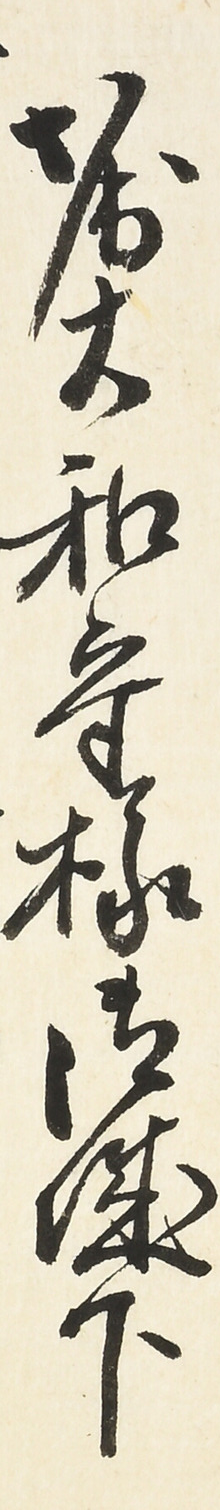堀大和守様御城下
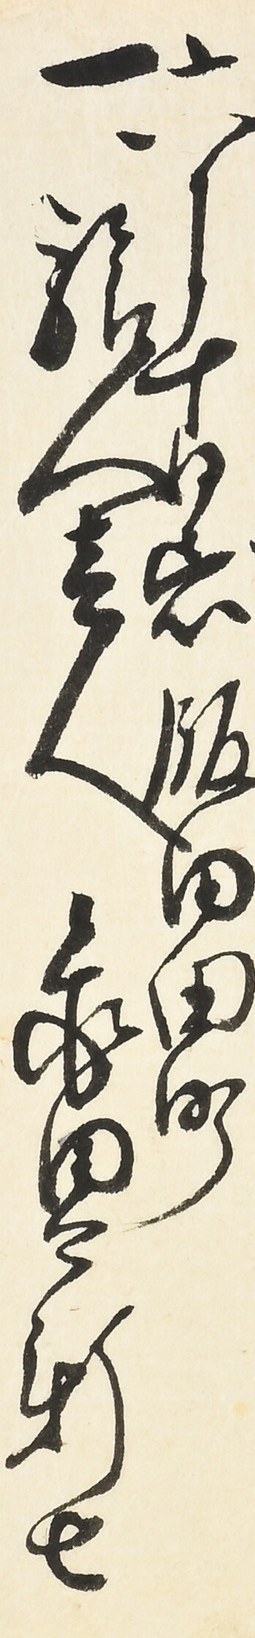一旅人壱人亀田や新七
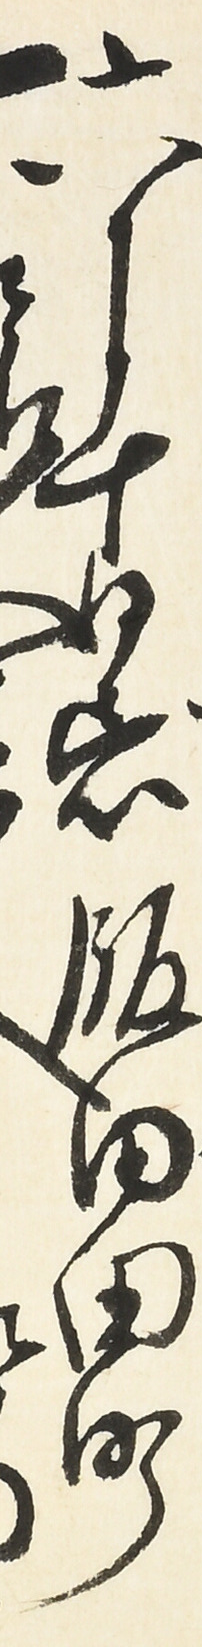六月十日着飯田田町
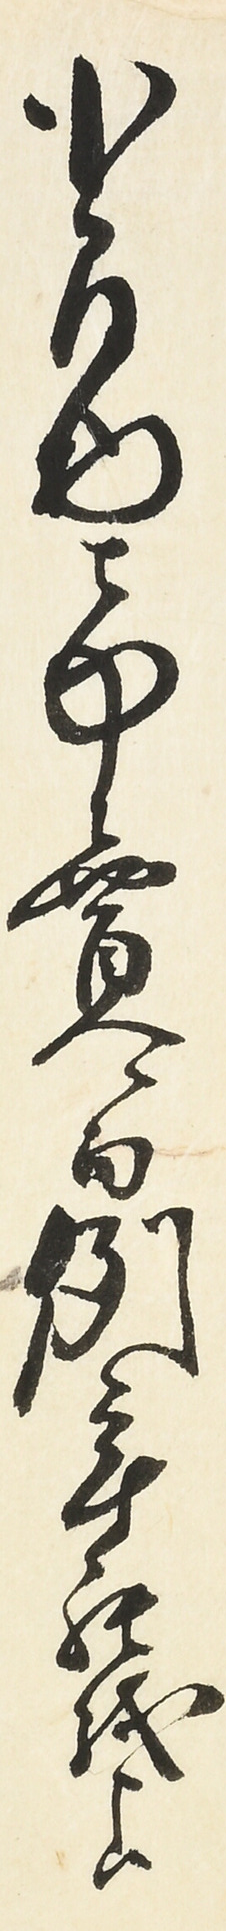小間物商売ニ而例年罷越申候
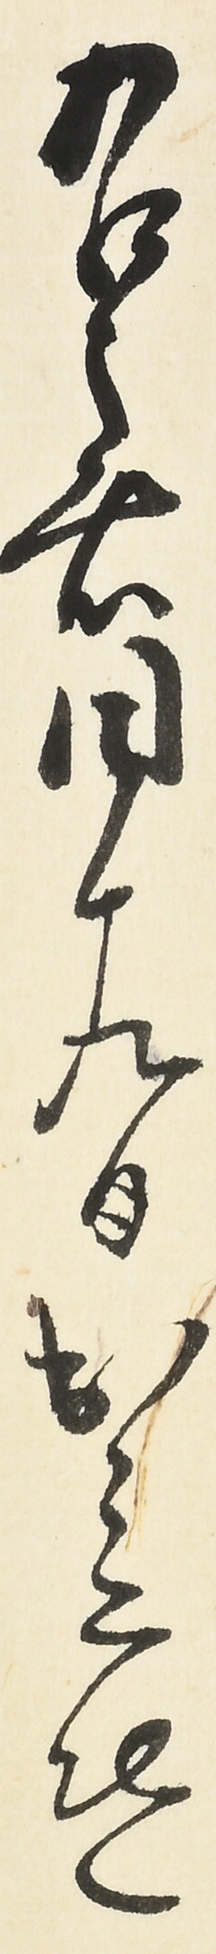右之者同十九日出立仕候
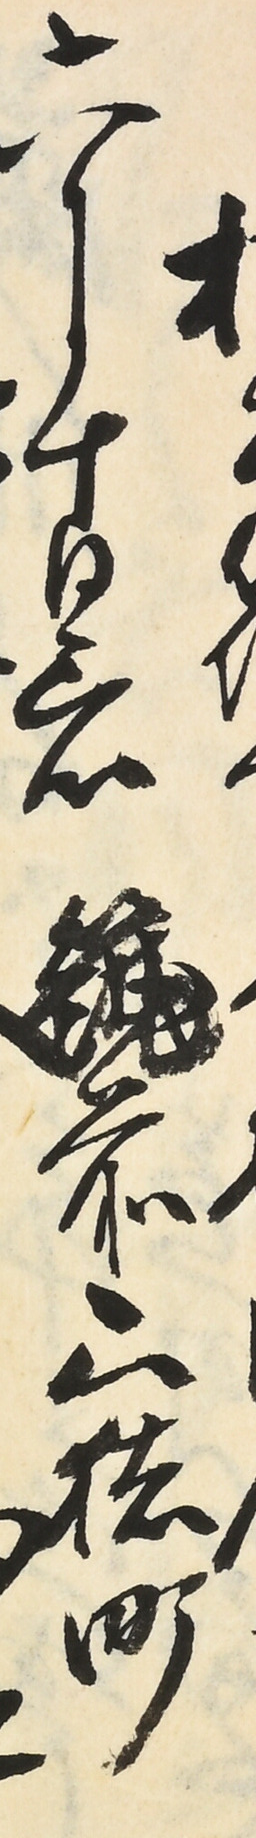六月十日着飯田田町

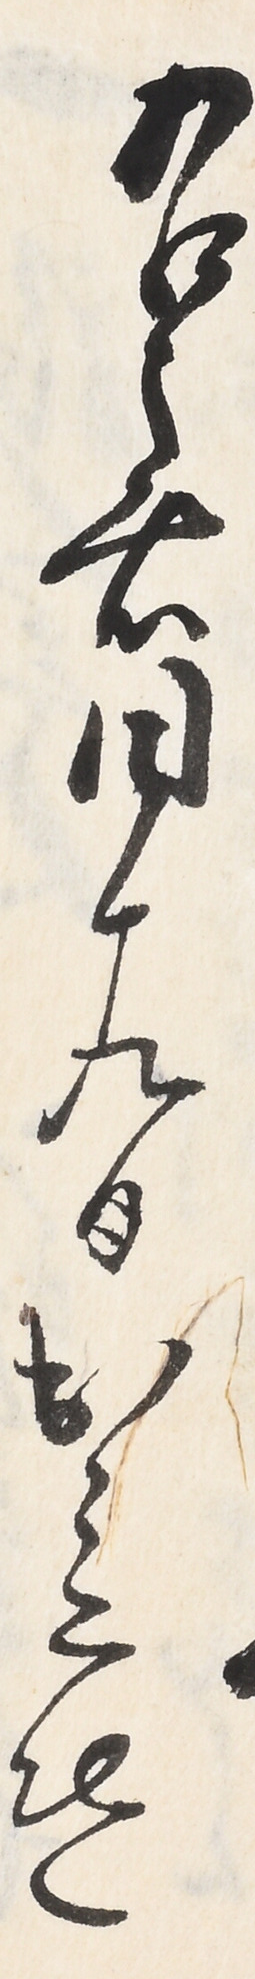右之者同十九日出立仕候
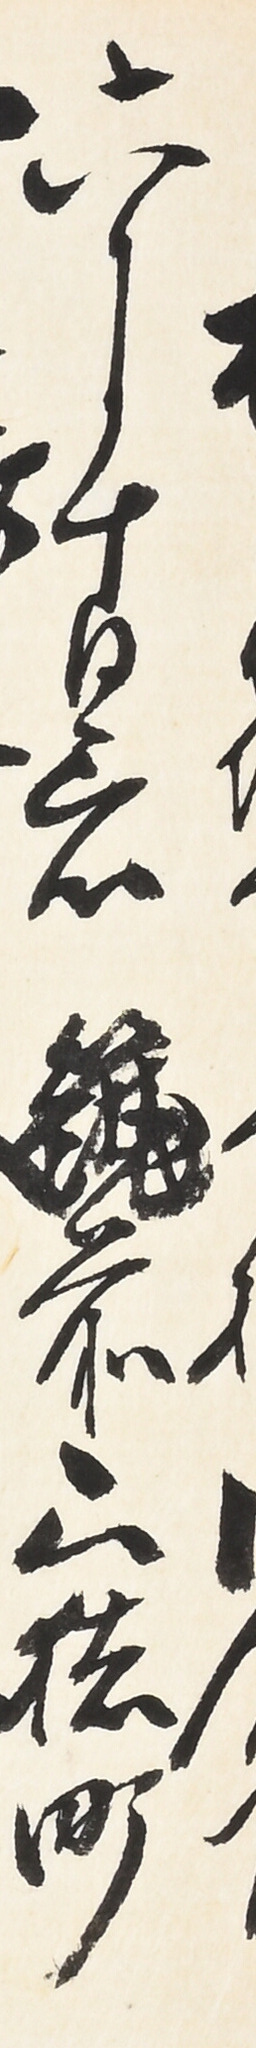六月十日着筑前山猪町
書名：町中旅人泊控帳
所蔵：伊那市立高遠町図書館・合同会社AMANE
